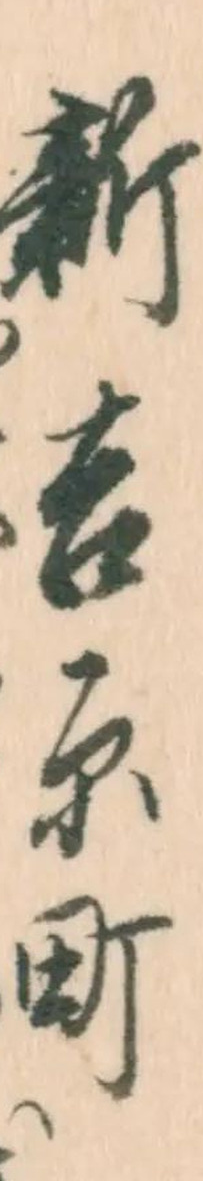新吉原町
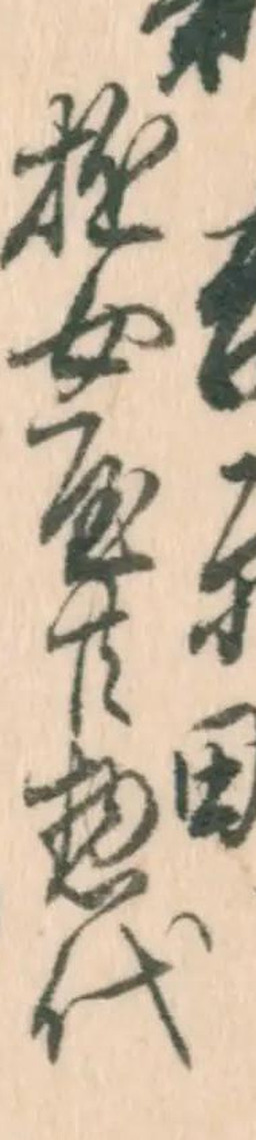遊女屋共惣代
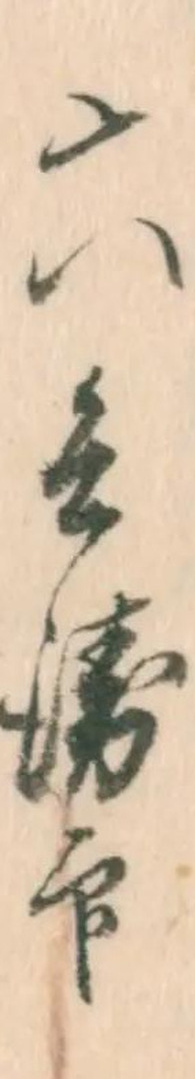六兵衛印
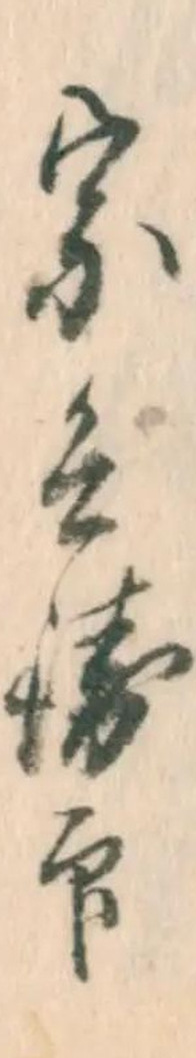宗兵衛印
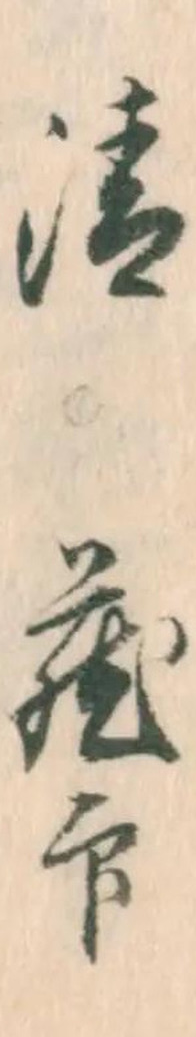清蔵印
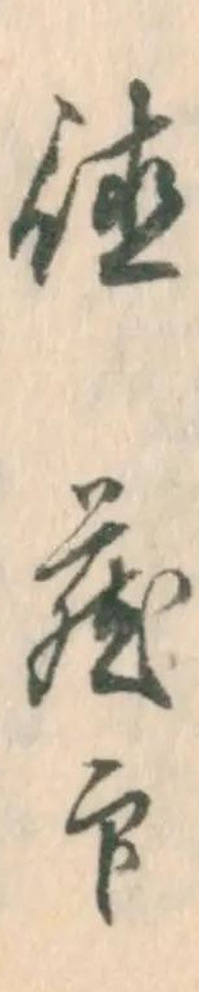徳蔵印
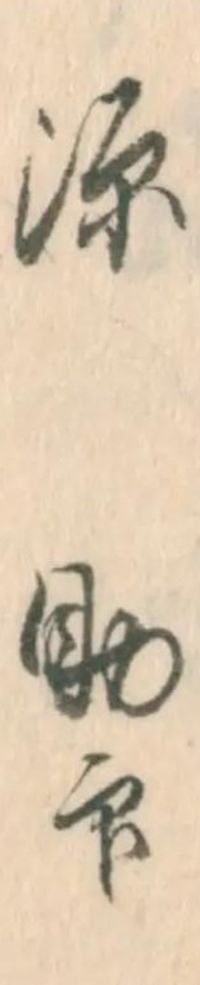源助印
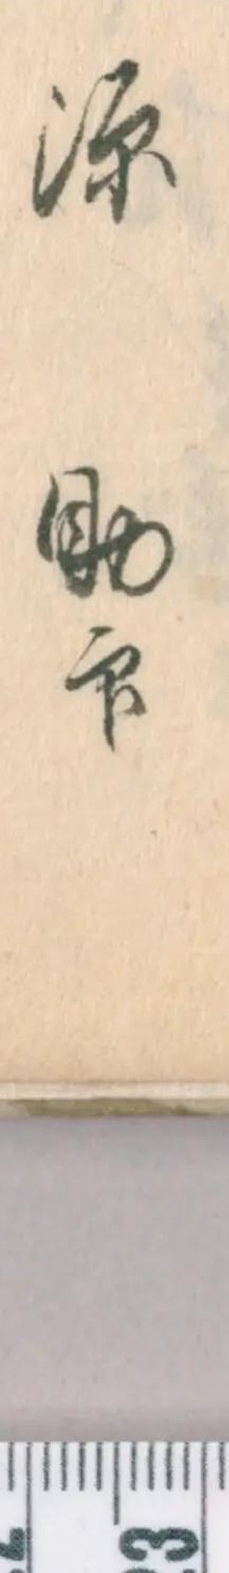源助印

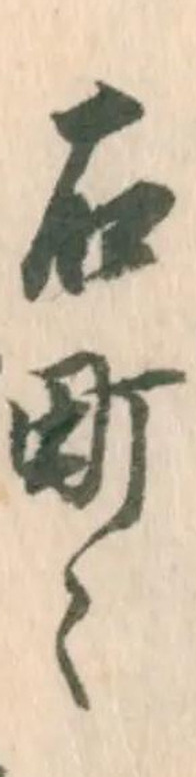右町〻
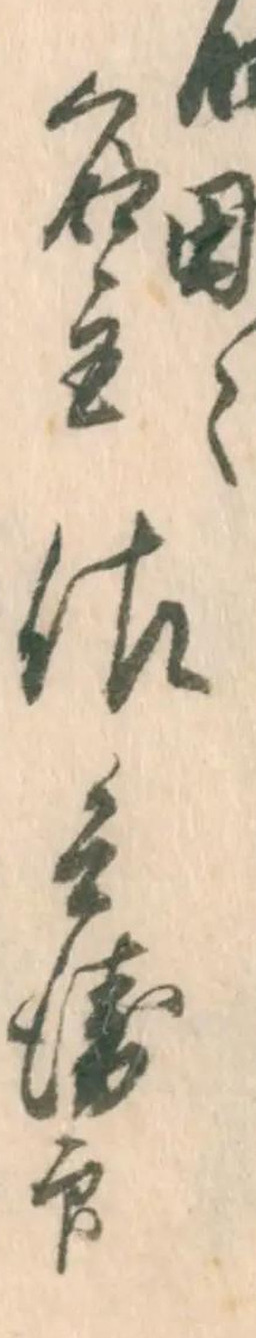名主佐兵衛印
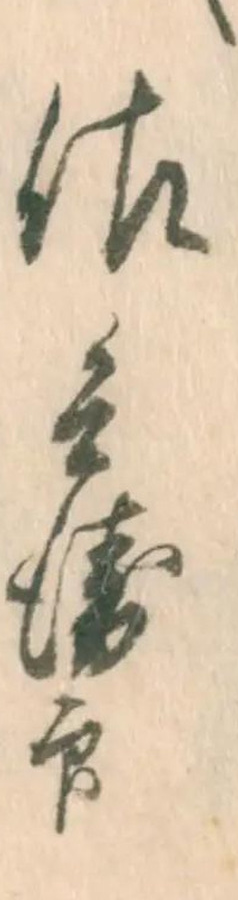名主佐兵衛印
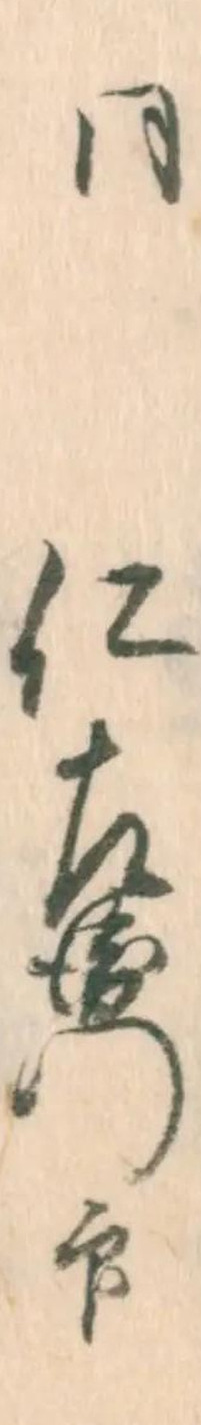同仁左衛門印
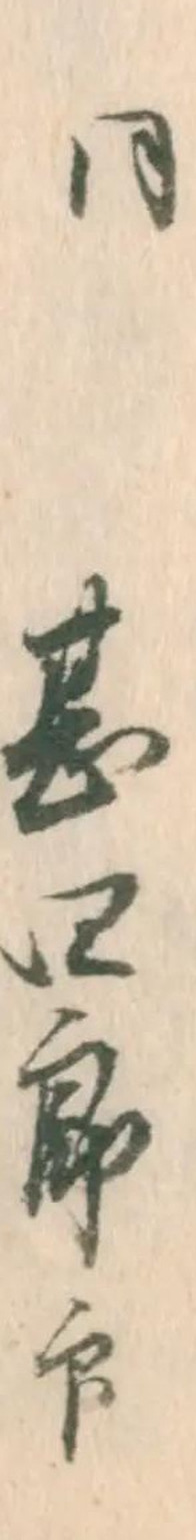同甚四郎印
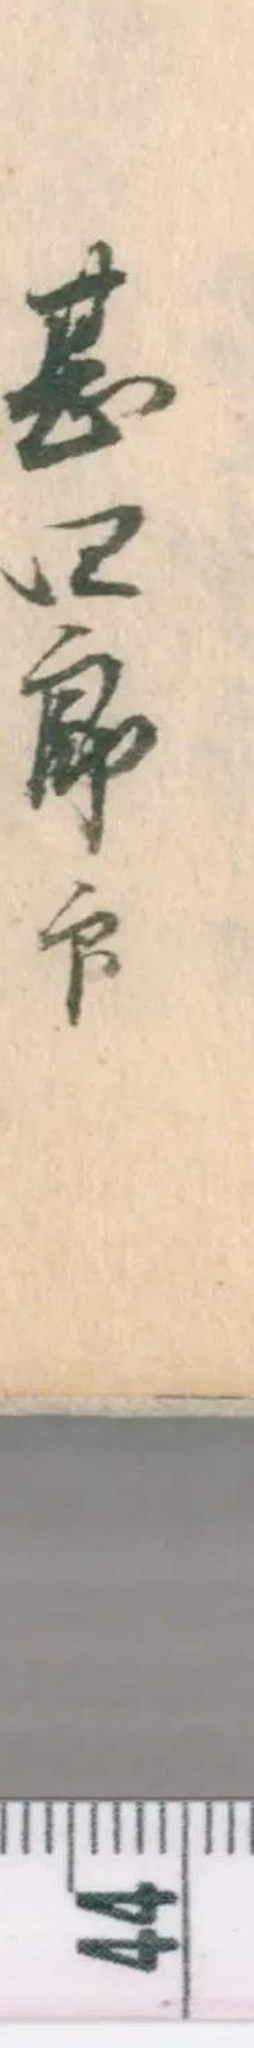同甚四郎印
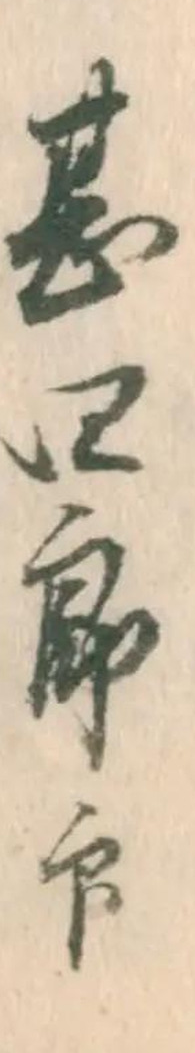同甚四郎印
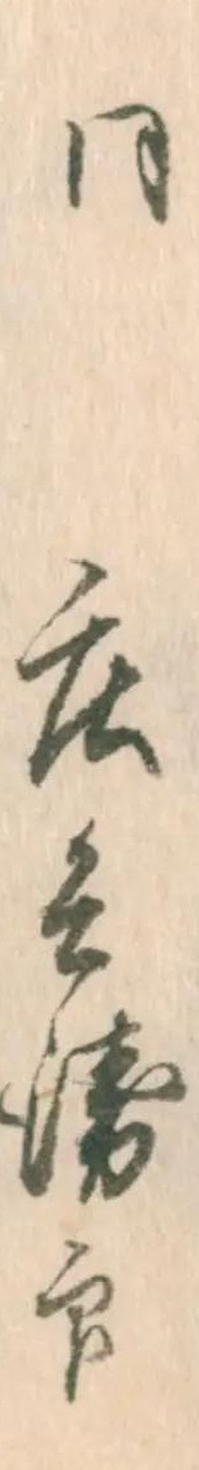同庄兵衛印
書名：地震災書留 2巻. [2] 内表紙に「地震一件　安政二卯年十月」とあり
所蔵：国立国会図書館 National Diet Library, JAPAN
